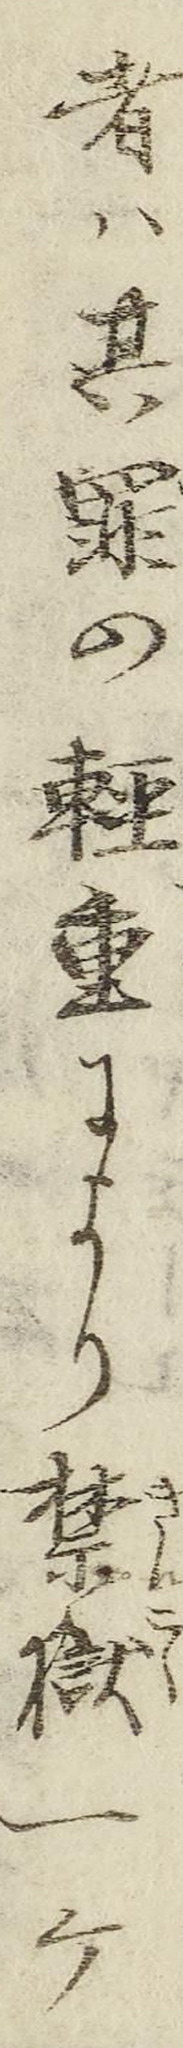者は其罪の軽重により禁獄一ケ

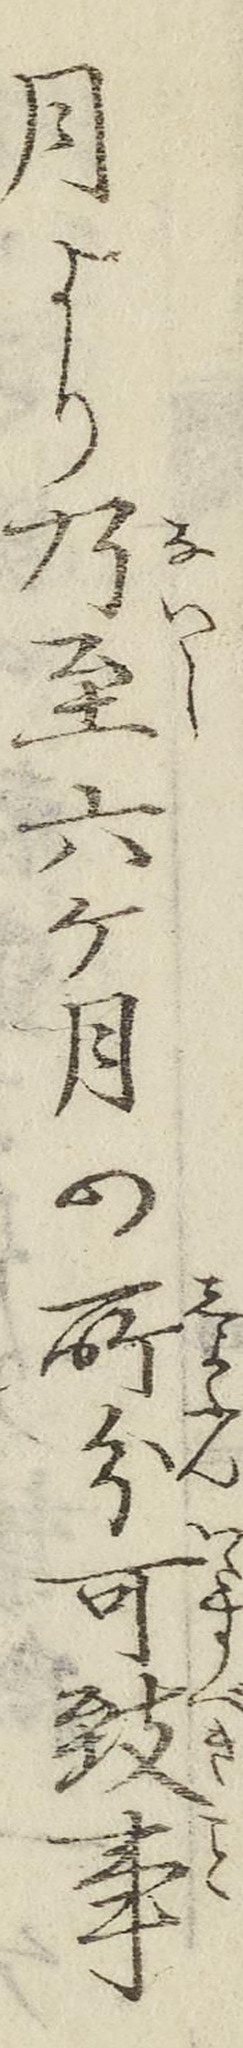月より乃至六ケ月の所分可致事
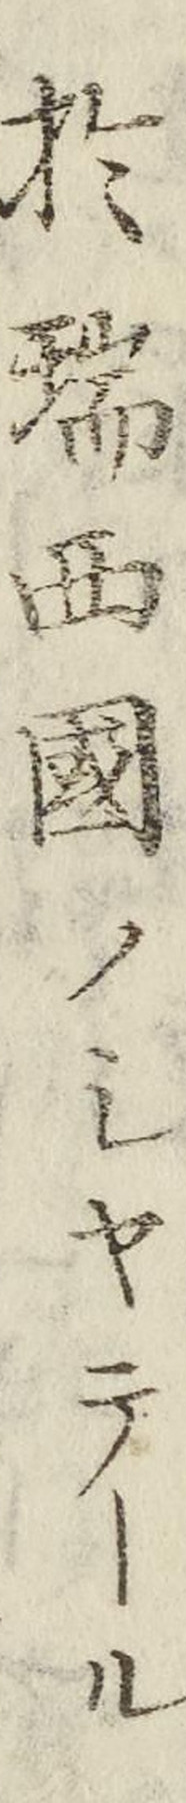於瑞西国ノシヤテール
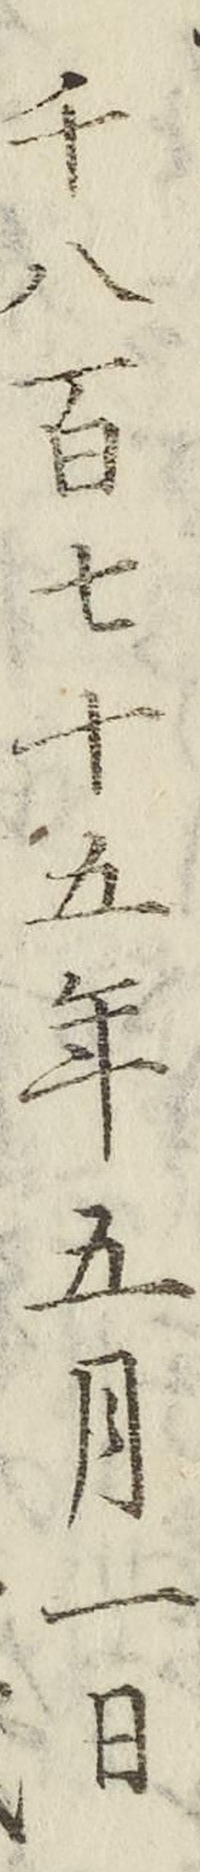千八百七十五年五月一日
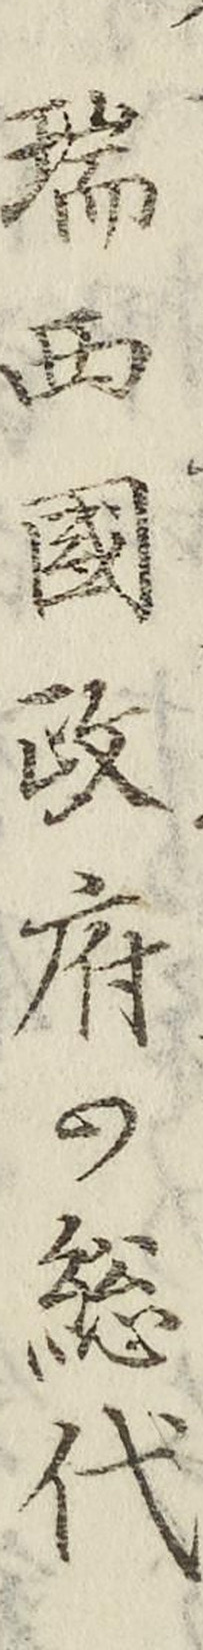瑞西国政府の総代
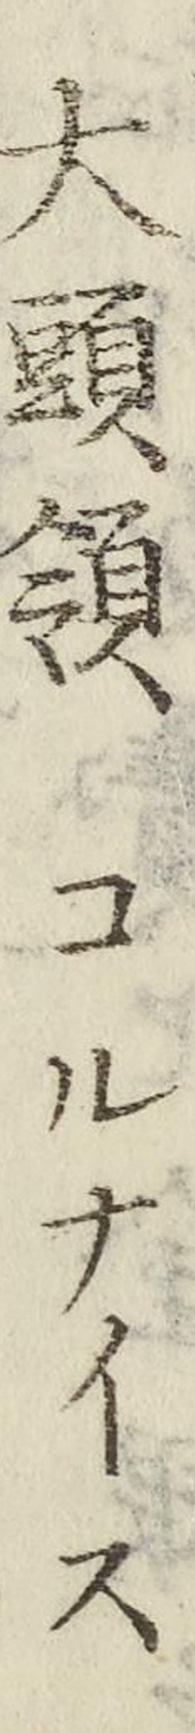大頭領コルナイス
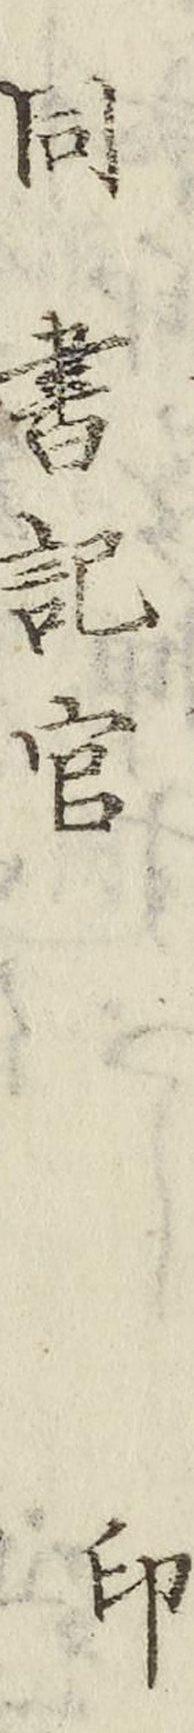同書記官印
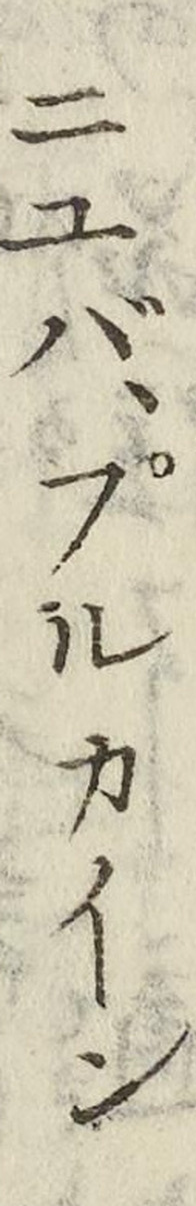ニユバ、プルカイン
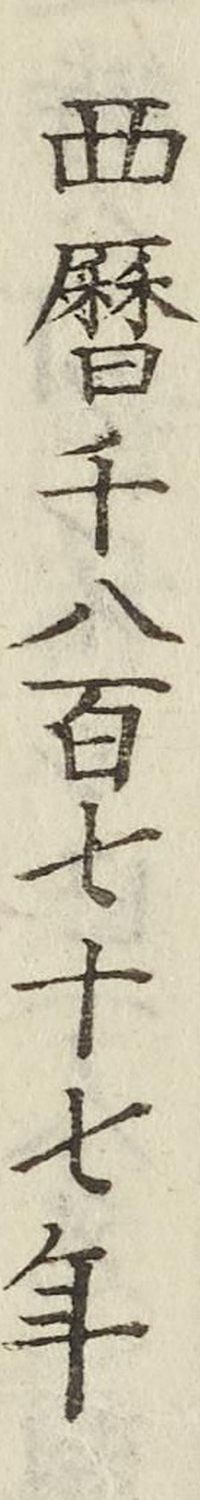西暦千八百七十七年
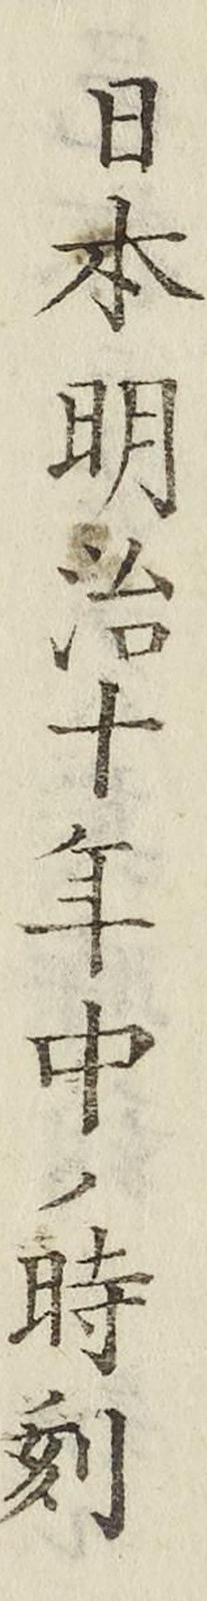日本明治十年中ノ時刻
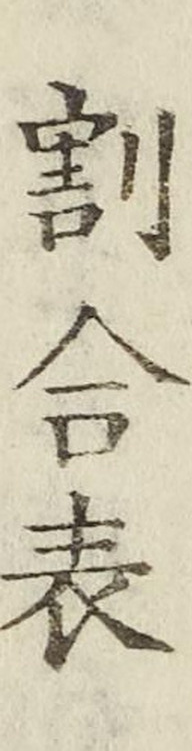割合表
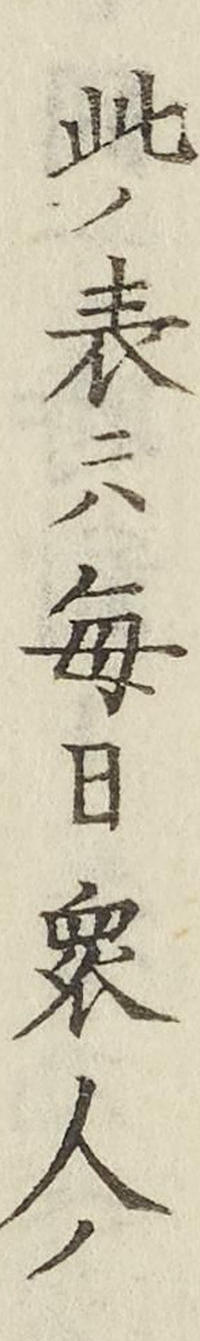此ノ表ニハ毎日衆人ノ
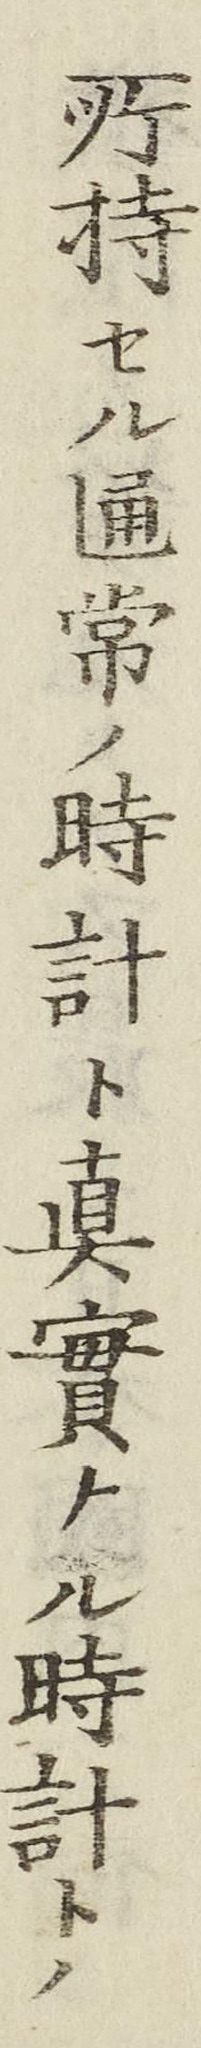所持セル通常ノ時計ト真実ナル時刻トノ
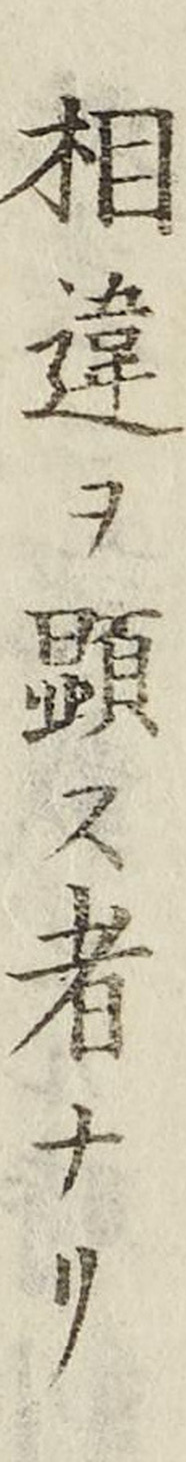相違ヲ顕ス者ナリ
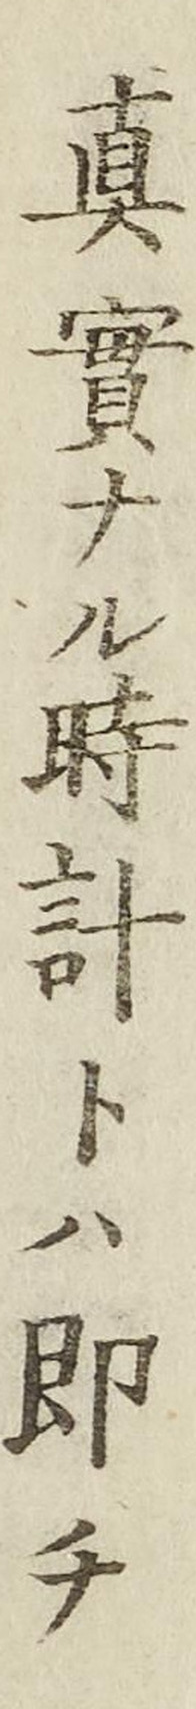真実ナル時計トハ即チ

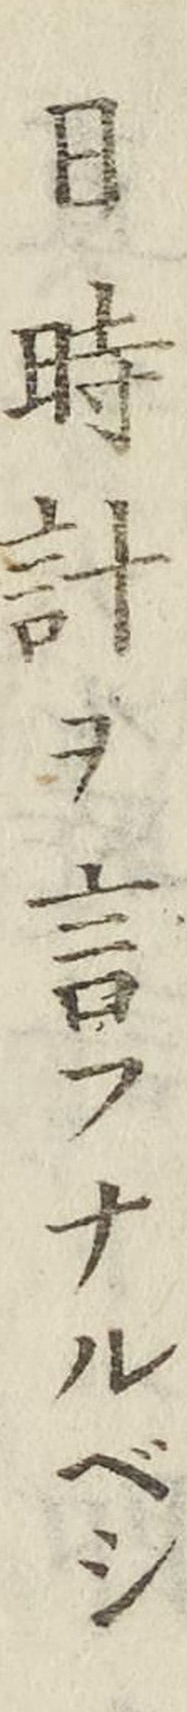日時計ヲ言フナルベシ
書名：[時計に関する冊子]
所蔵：東京大学地震研究所図書室 Earthquake Research Institute Library, The University of Tokyo, JAPAN
